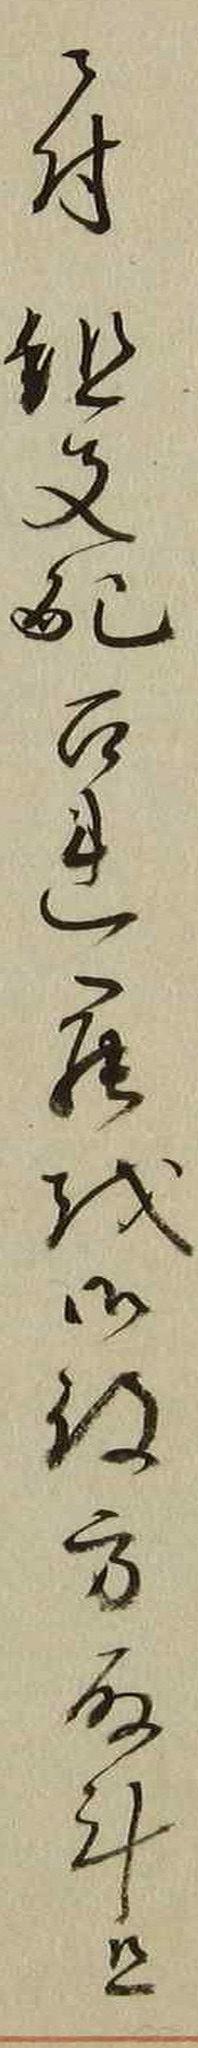に付組支配召連罷越御役方取計且
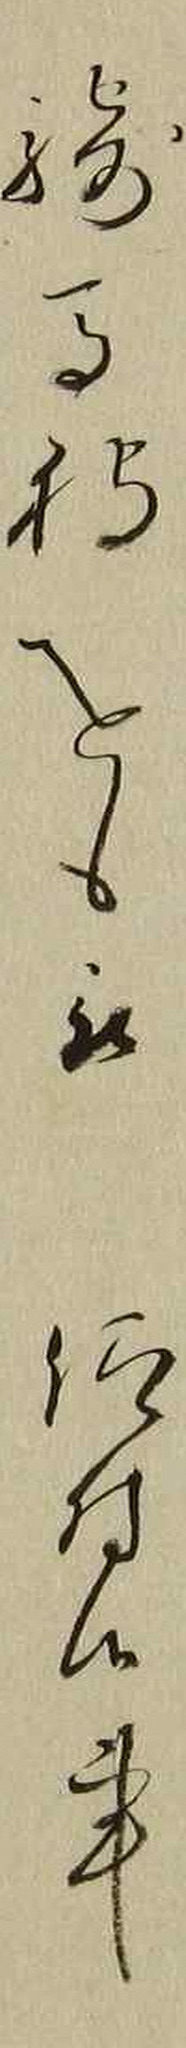騎馬狩をも被仰付候事
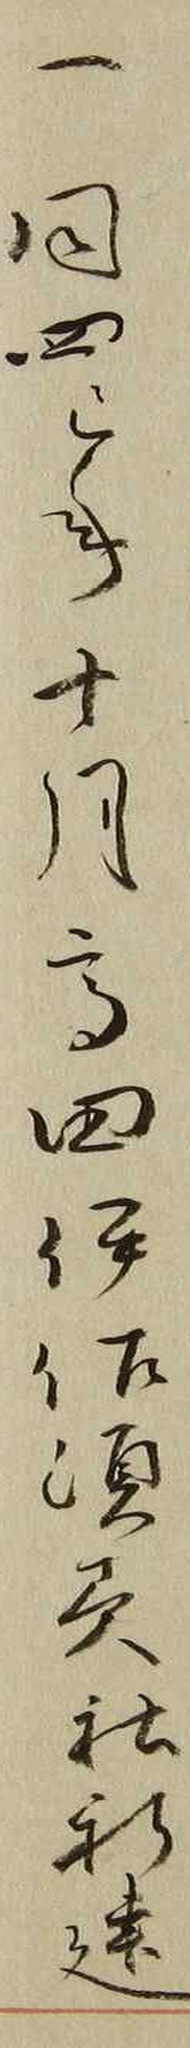一同四巳年十月高田伊佐須美社新建
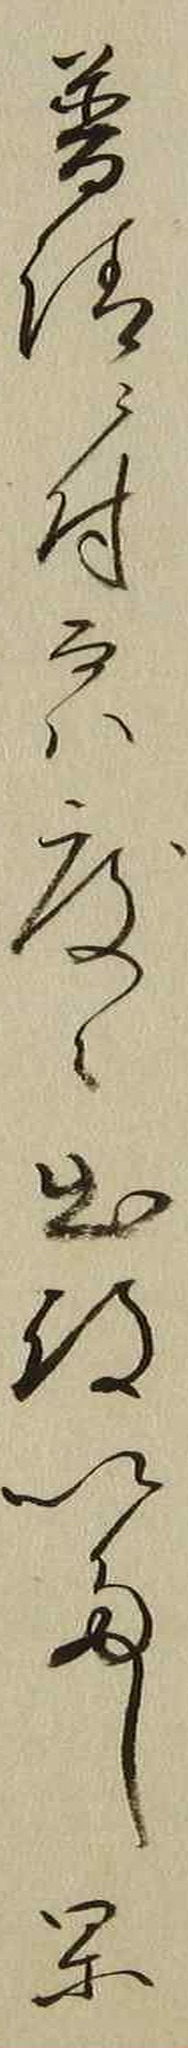普請に付而は度々出役いたし果
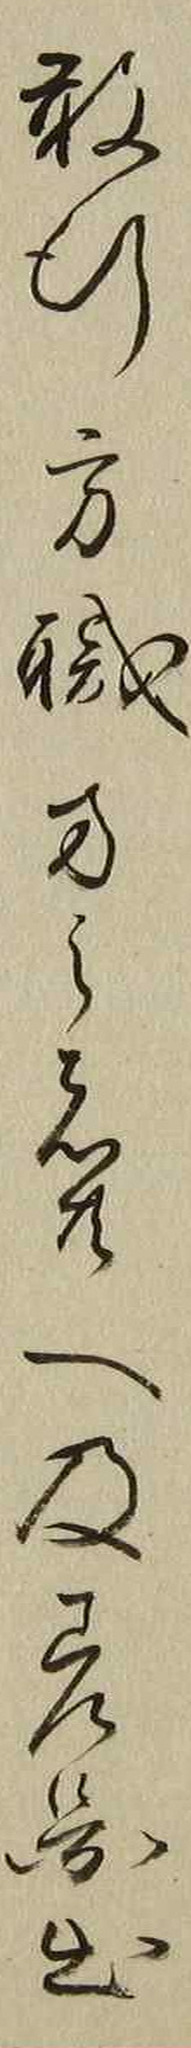敢行方職方之者共へ及差図出
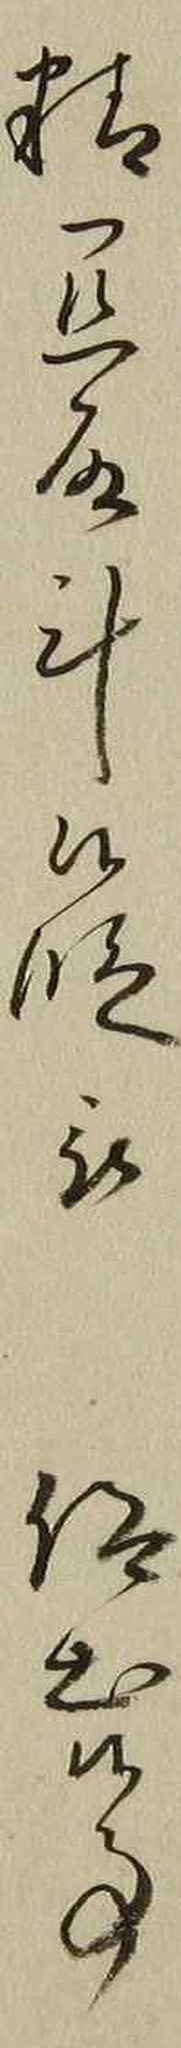精宜取計候段被仰出候事
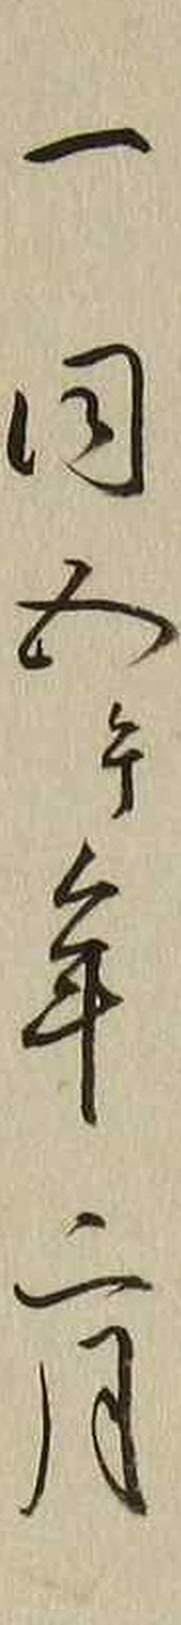一同五午年二月
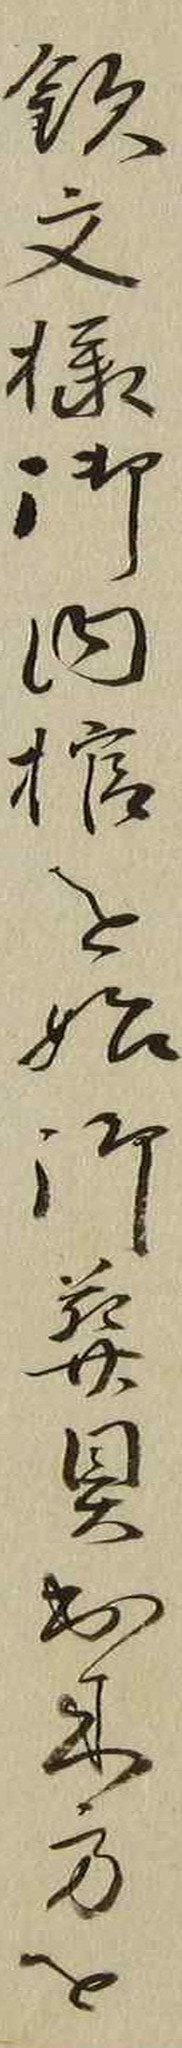欽文様御内棺を始御葬具出来方を
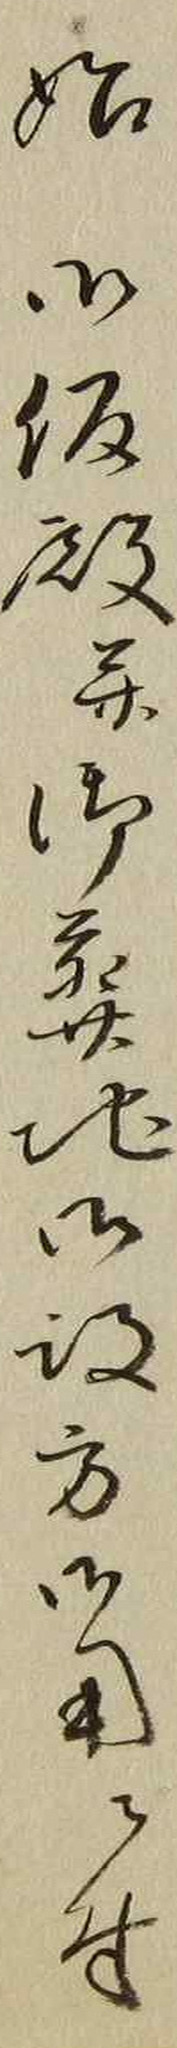始御仮殿并御葬地御役方御用に付
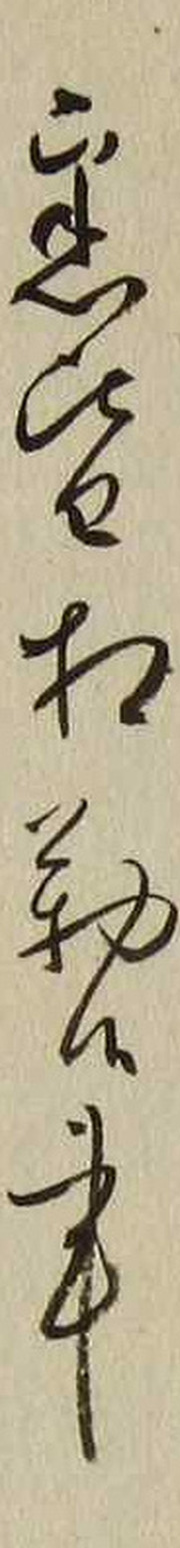悉皆相勤候事
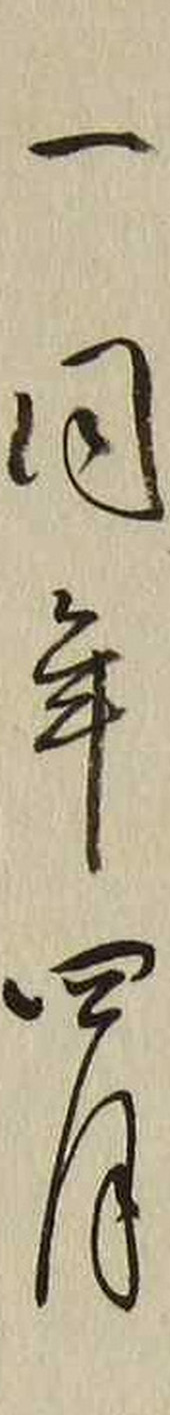一同年四月
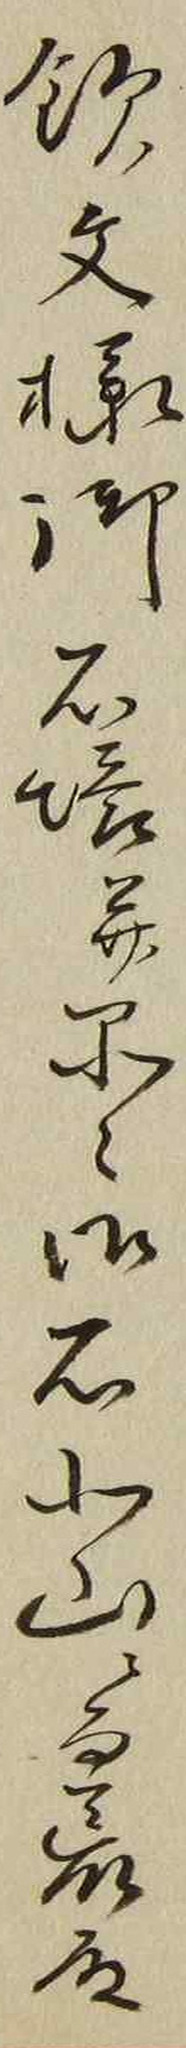欽文様御石塔并品々御石北山に而荒取
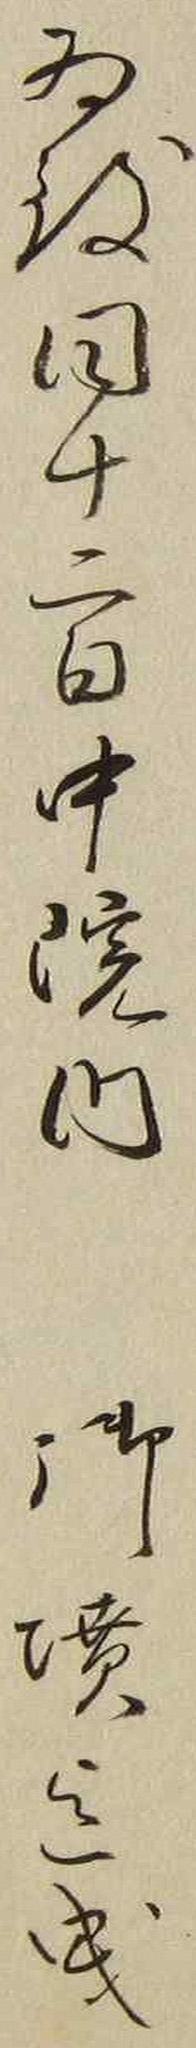為致同十二日中院内御墳迄曳

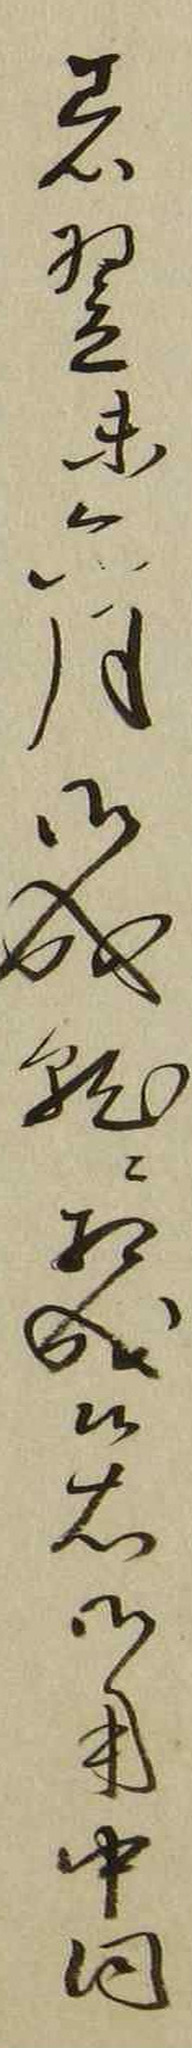着翌未六月御成就に相成候右御用中同
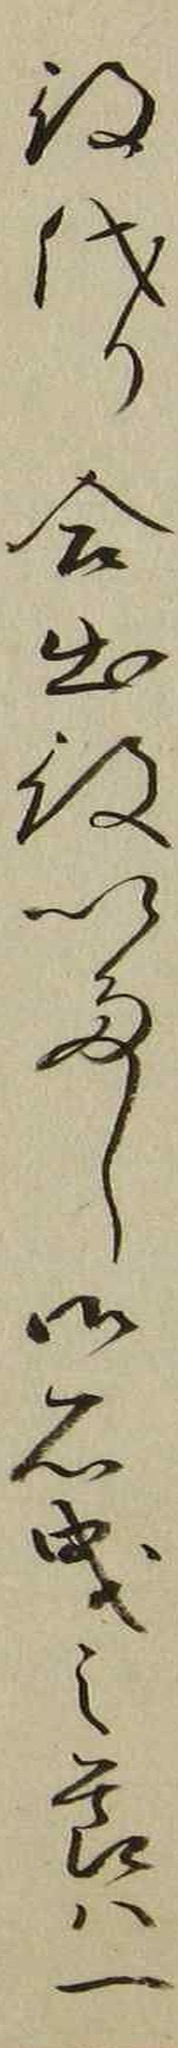役代り合出役いたし御石曳之節は一
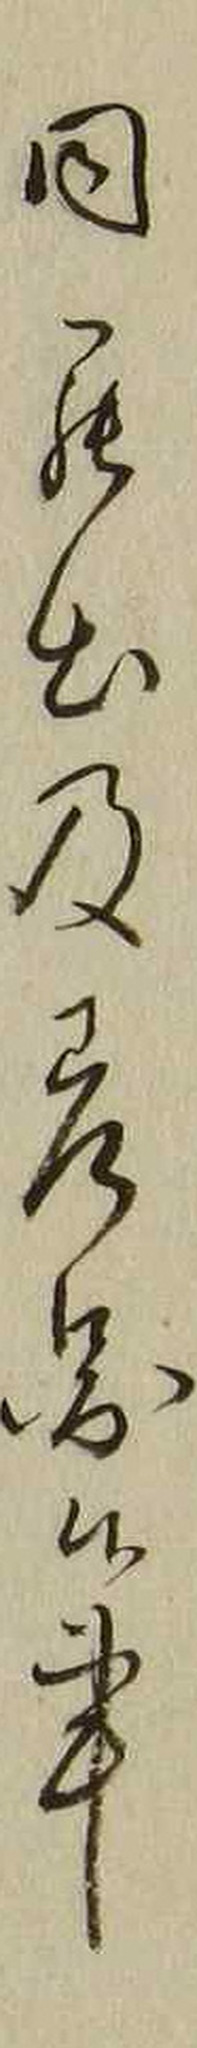同罷出及差圖候事
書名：諸士系譜　巻之3　い之部3
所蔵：会津若松市立会津図書館
